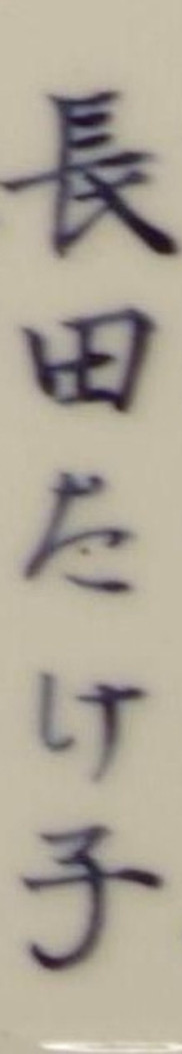長田たけ子
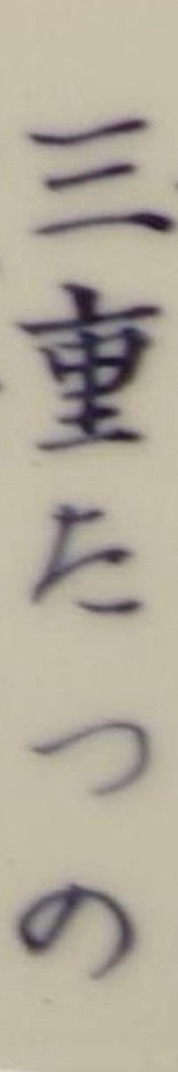三重たつの
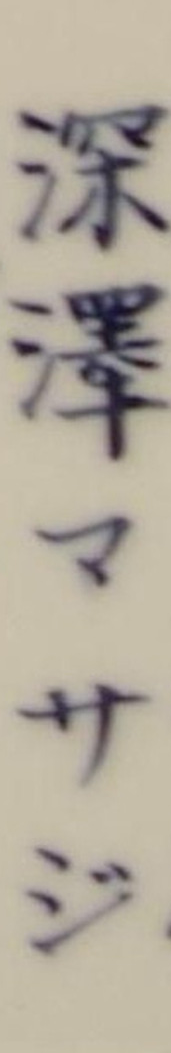深澤マサジ
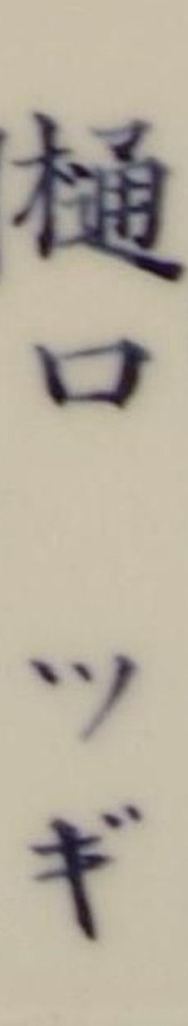樋口ツギ
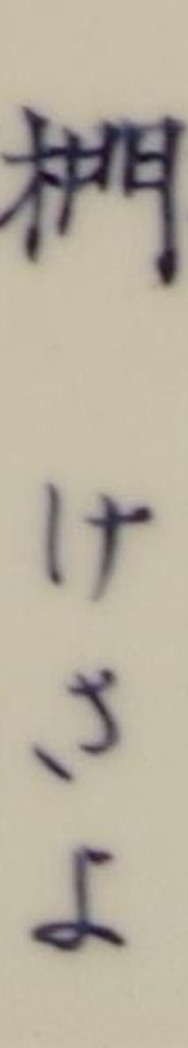椚けさよ
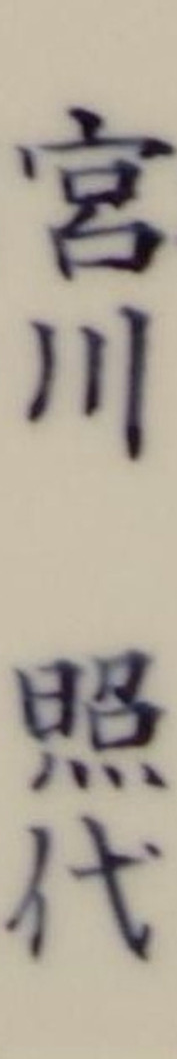宮川照代
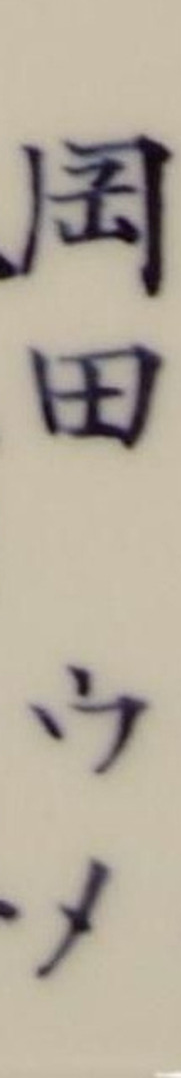岡田ウメ
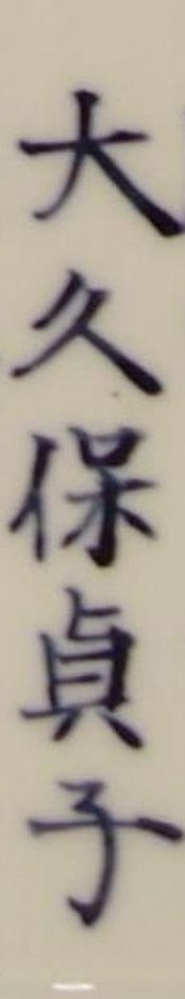大久保貞子
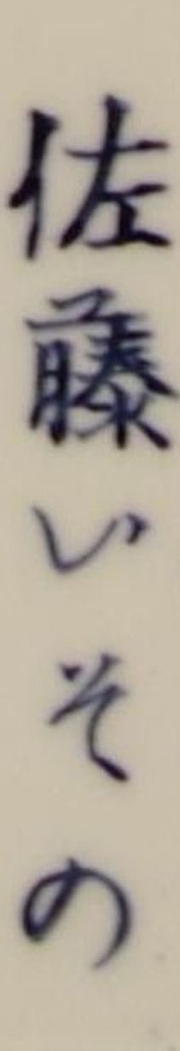佐藤いその
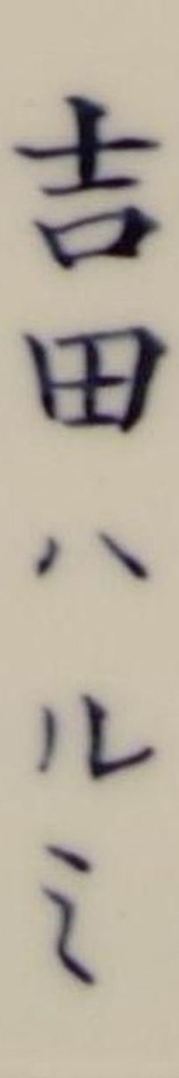吉田ハルミ
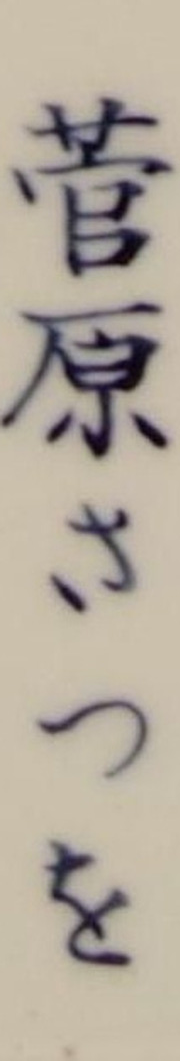菅原さつを
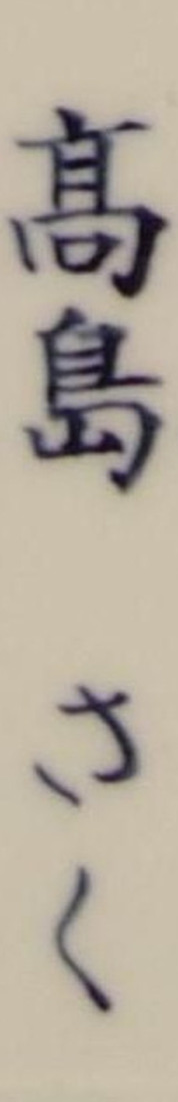高島さく
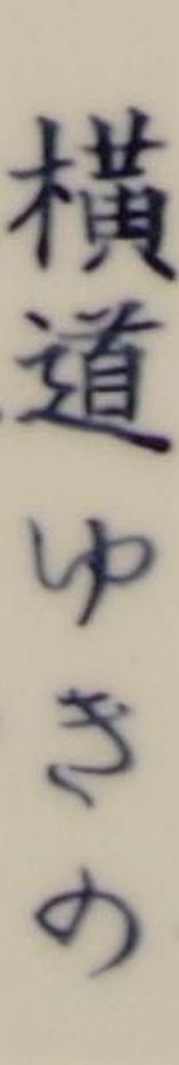横道ゆきの
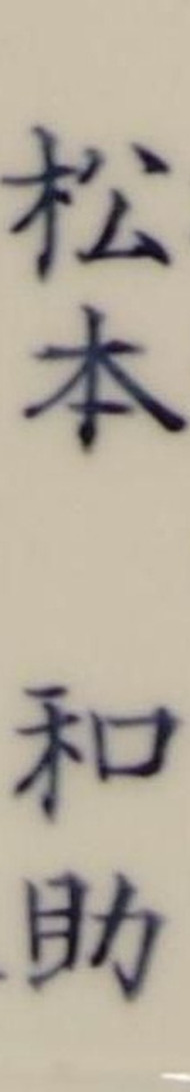松本和助
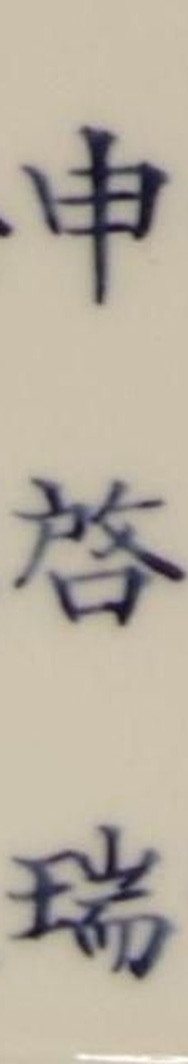申啓瑞
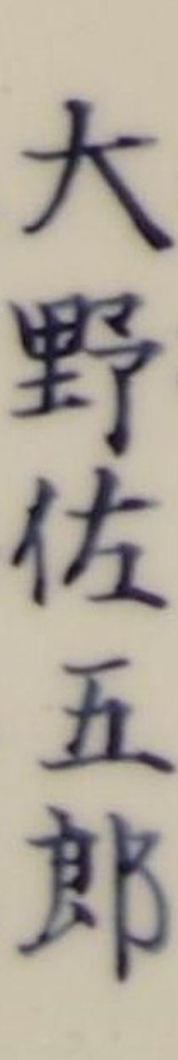大野佐五郎
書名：M~S
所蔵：高野山金剛峯寺
